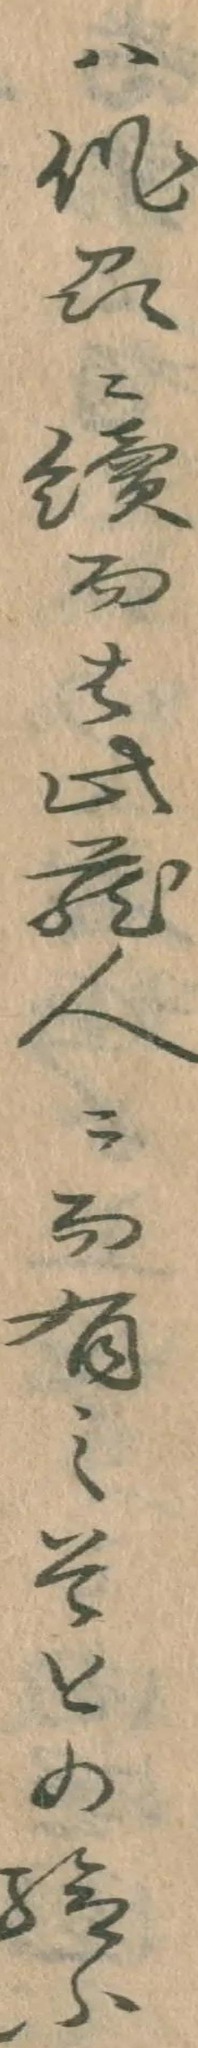は作州に続而者此蔵人に而有之そとの給ふ
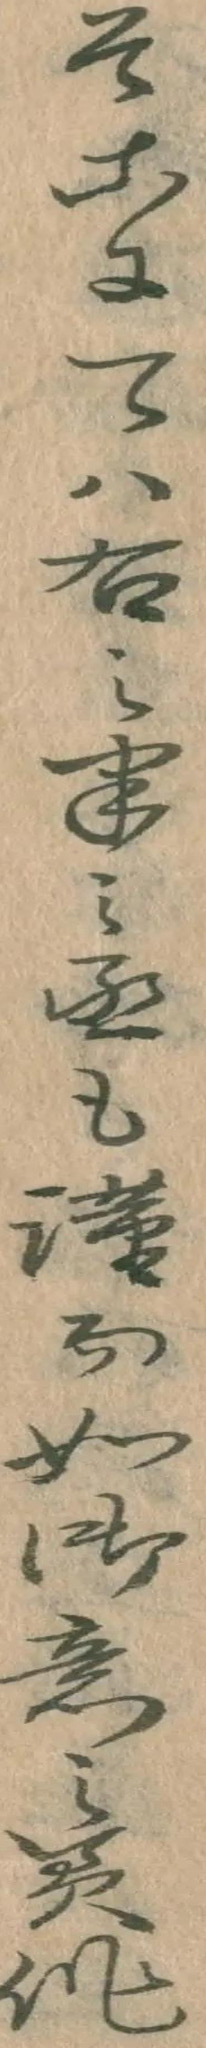そ古尓ては右之半之丞も謹而如御意之美作
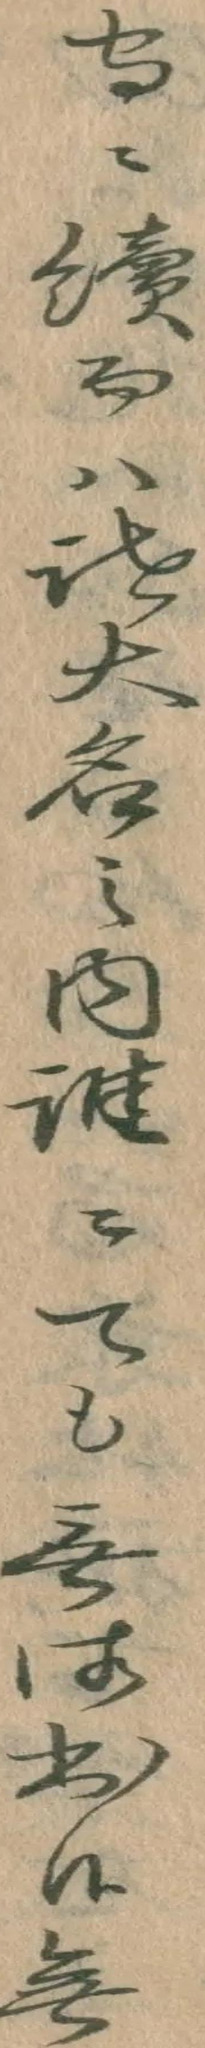守に続而は諸大名之内誰にても無御出候無
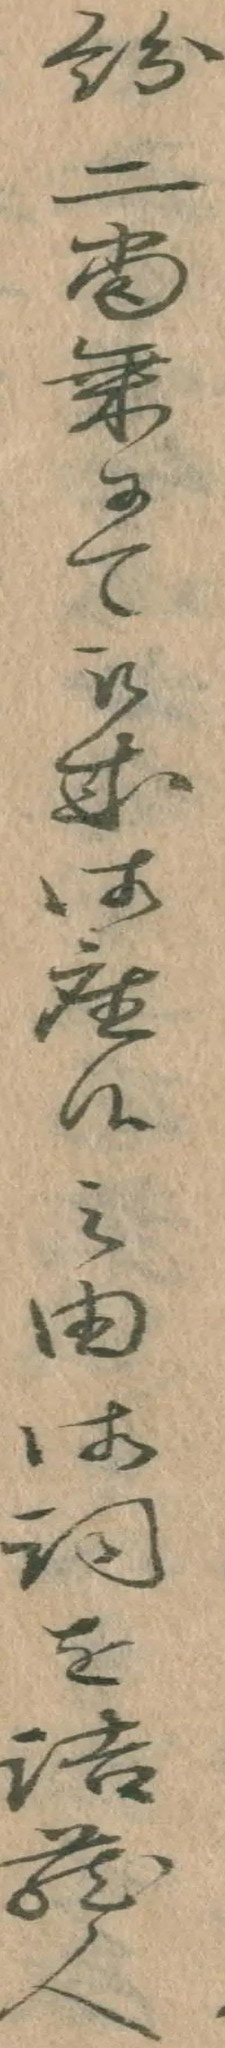紛二番乗尓て被成御座候之由御詞を詰蔵人
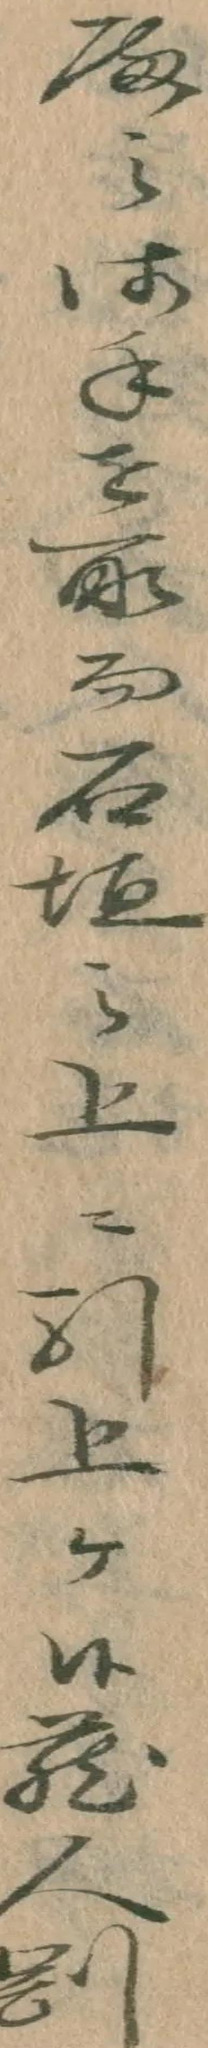殿之御手を取而石垣之上に引上け候蔵人別
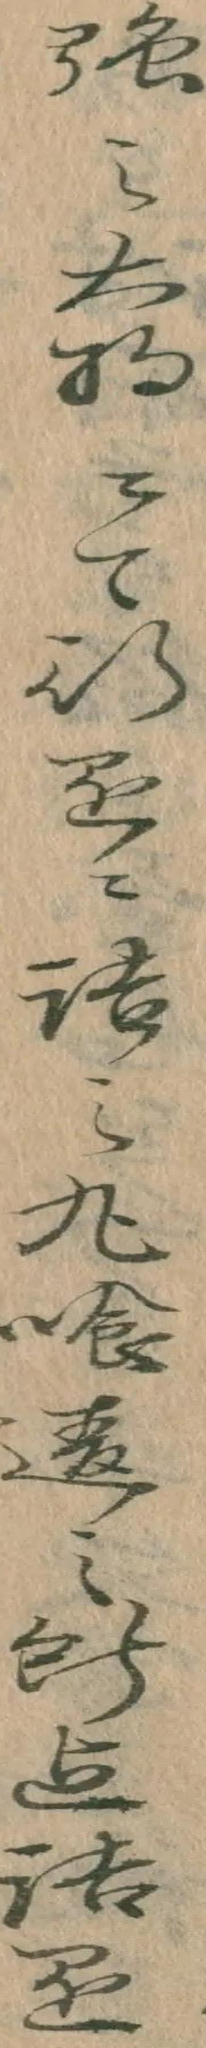強之大将にて行懸に詰之丸食違之所迄詰懸
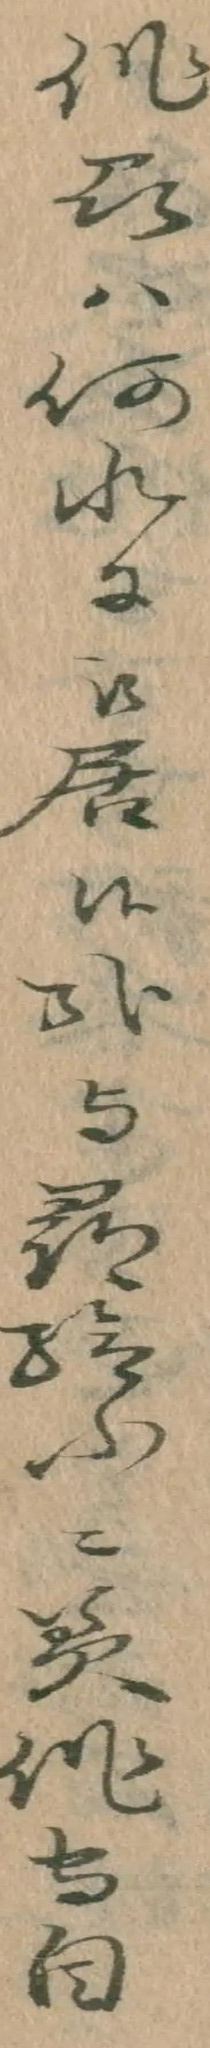作州は何れ尓被居候哉与尋給ふに美作守自
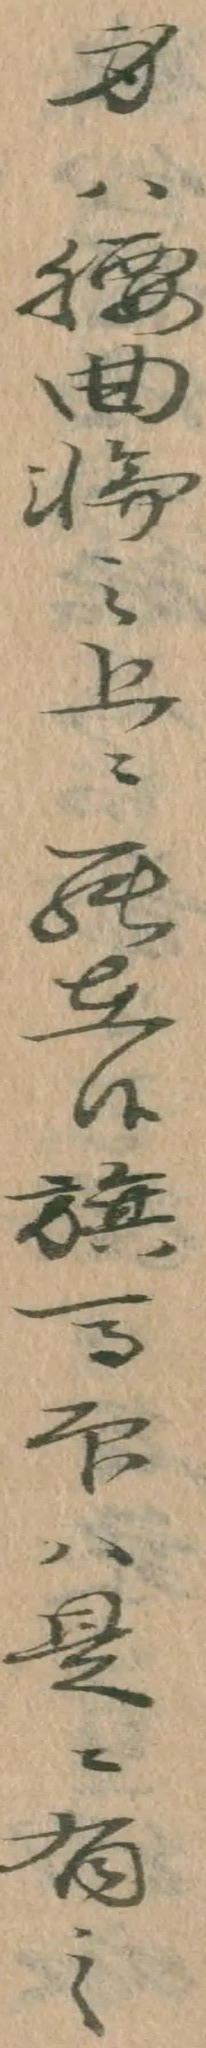身は腰曲輪之上に罷在候旗馬印は是に有之
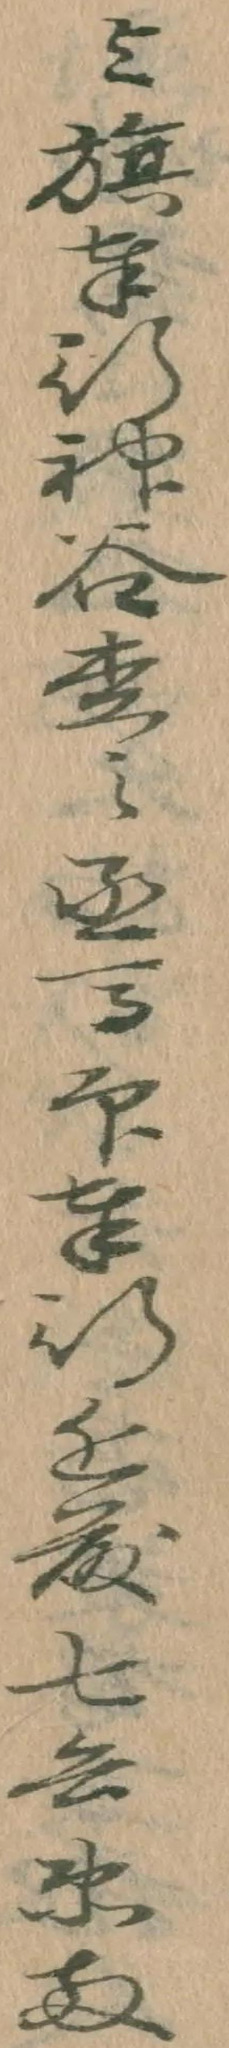与旗奉行神谷杢之丞馬印奉行近藤七兵衛両
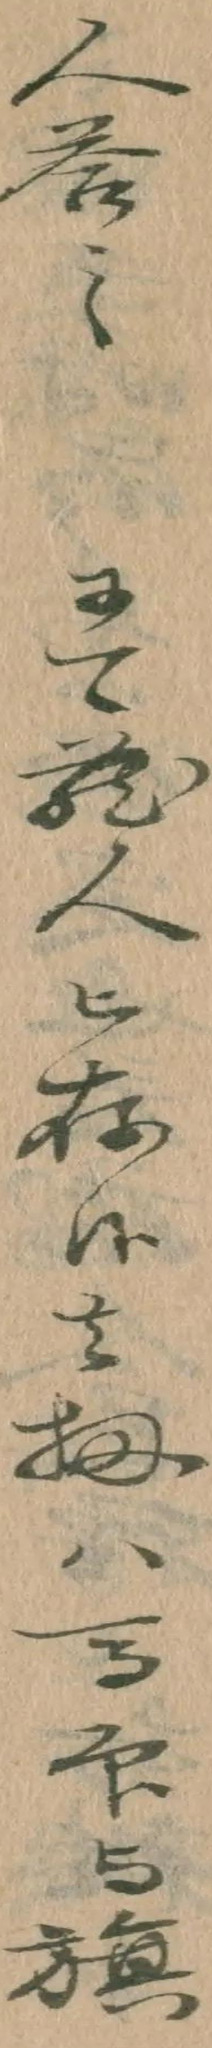人答之尓て蔵人被存候者扨は馬印与旗
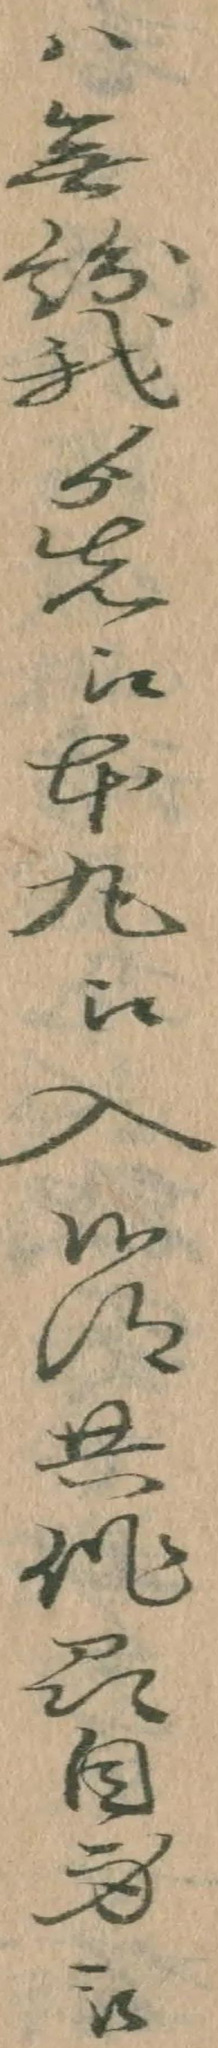は無紛我ゟ先江本丸江入候得共作州自身被
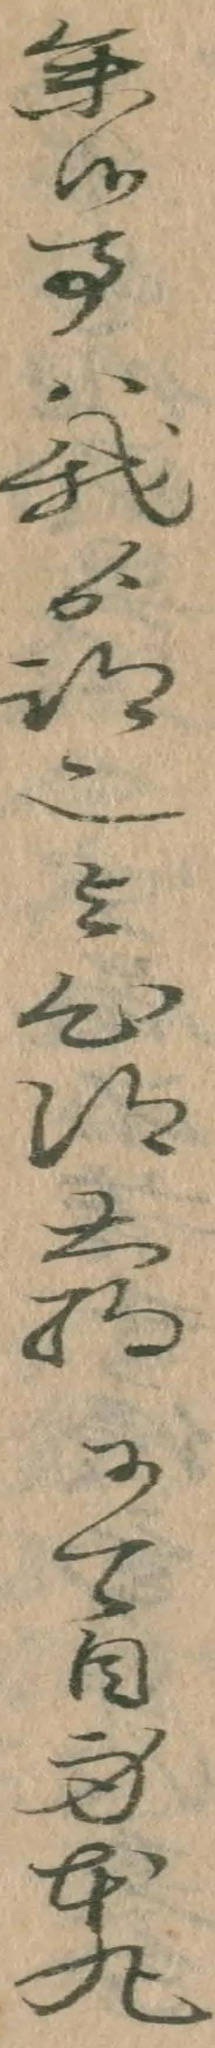参候事は我ゟ跡也与心得大将尓て自身本丸
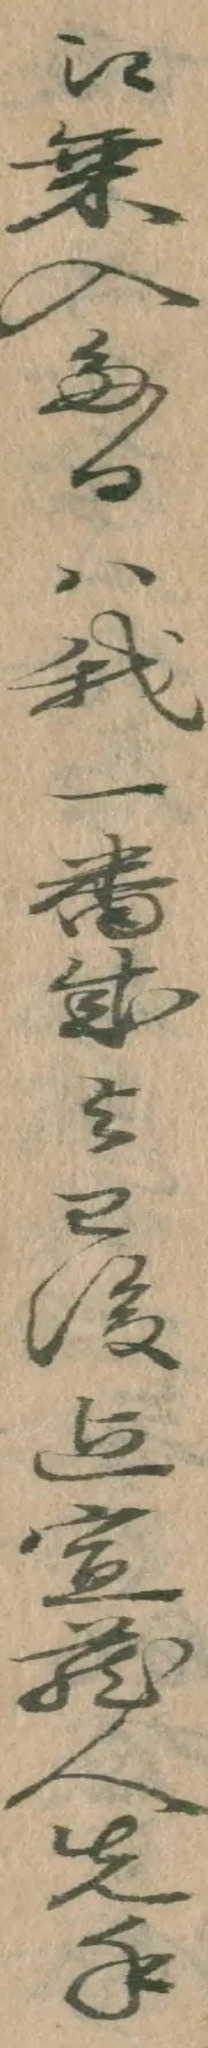江乗入多るは我一番成与已後迄宣蔵人先手
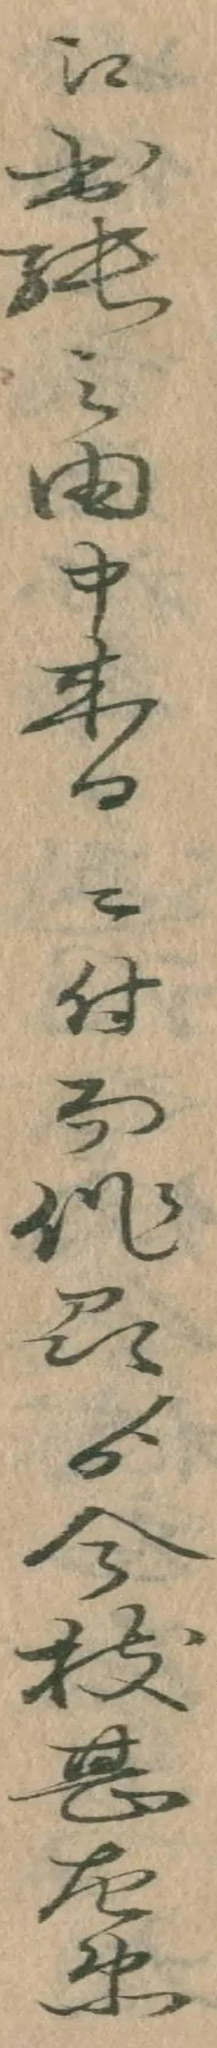江出張之由申来るに付而作州ゟ今枝甚左衛
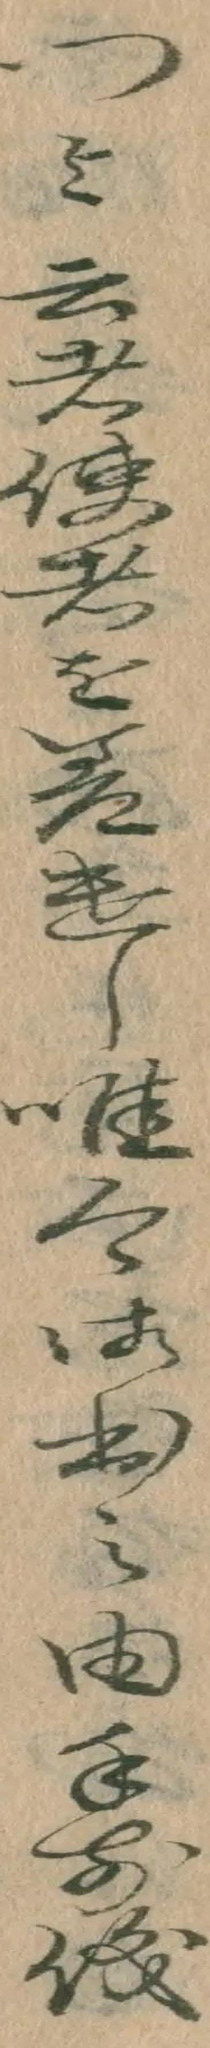門与云者使者を差遣し唯今御出之由手前儀
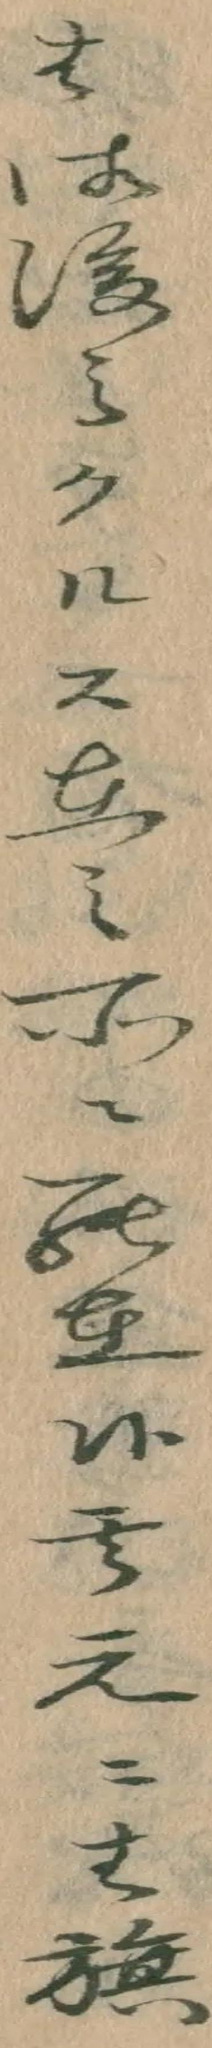者御後之クルス在之所に罷在候其元に者旗
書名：切支丹御退治記 49巻. [7]
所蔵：国立国会図書館 National Diet Library, JAPAN
